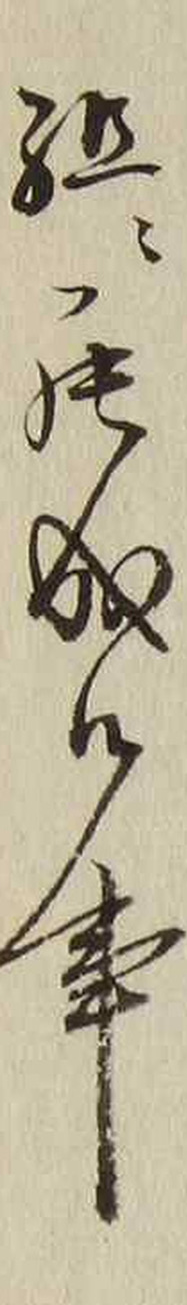組ニ罷成候事
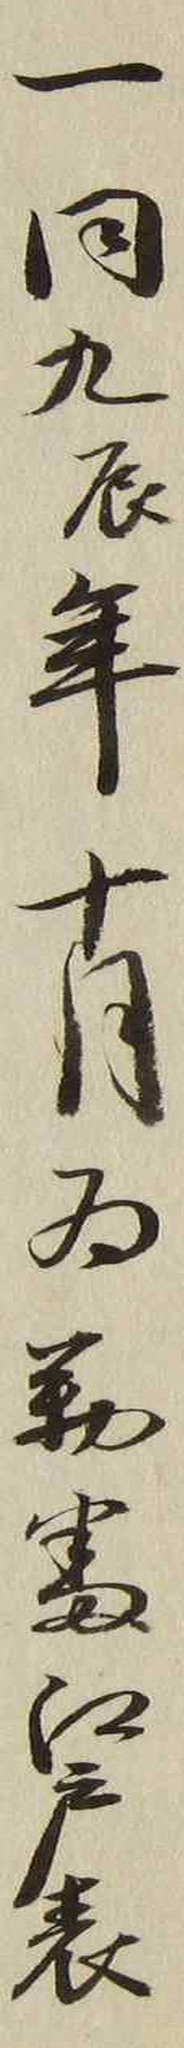一同九辰年十月為勤番江戸表
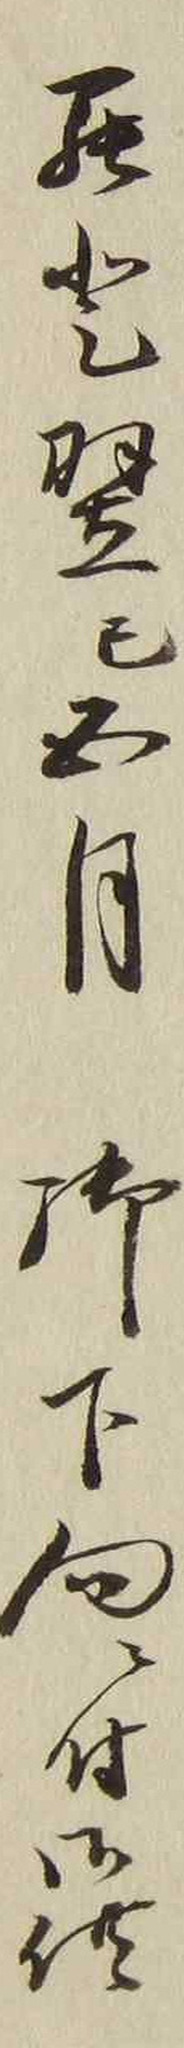罷登翌巳五月御下向ニ付御供

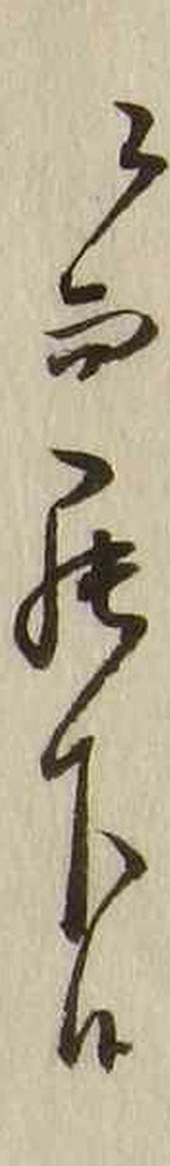ニ而罷下候
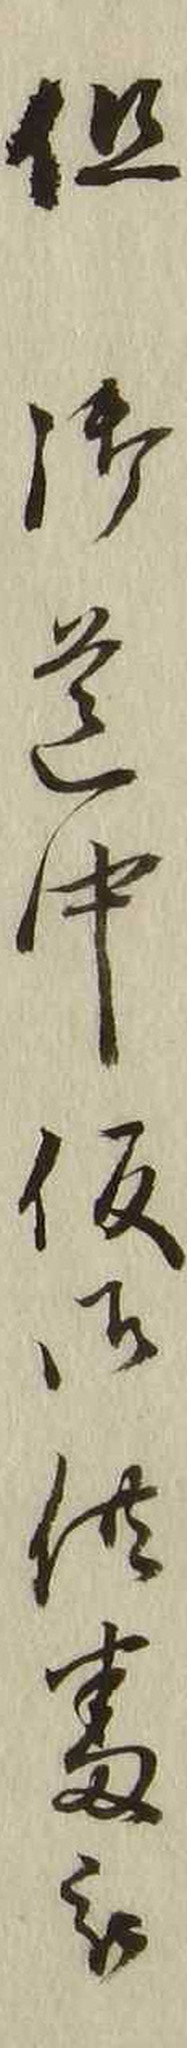但御道中仮御供番被
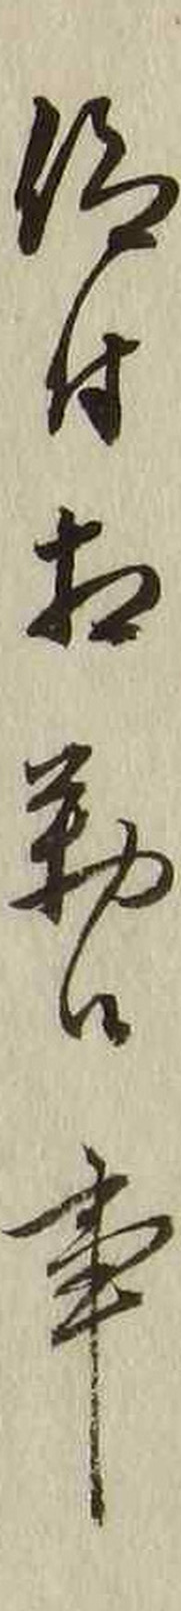仰付相勤候事
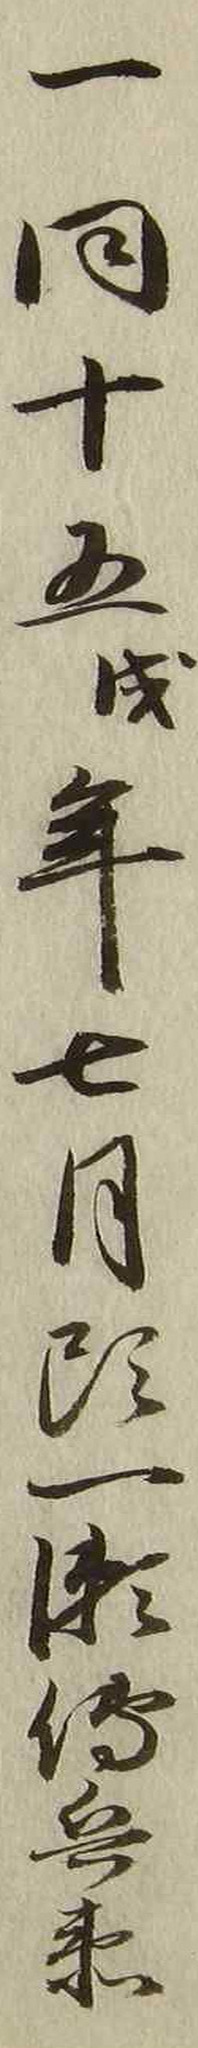一同十五戌年七月頭一瀬伝兵衛
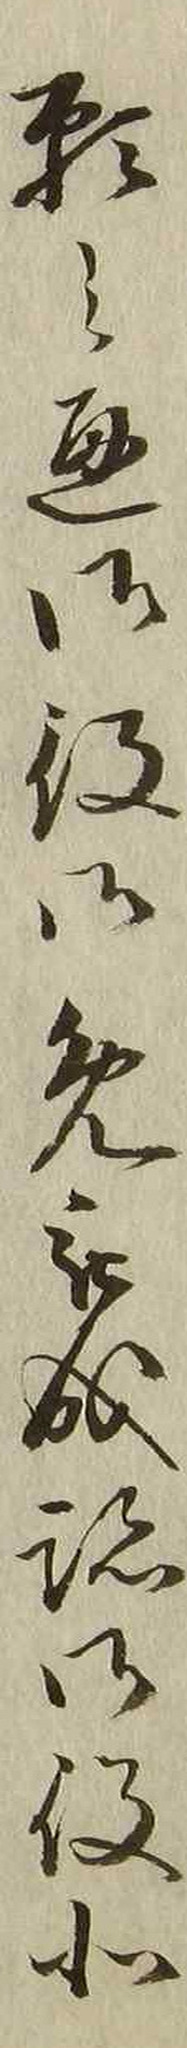願之通御役御免被成跡御役北
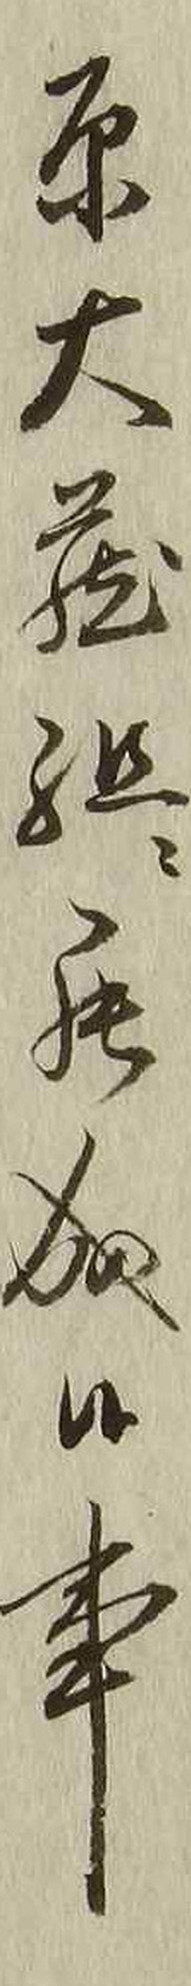原大蔵組ニ罷成候事
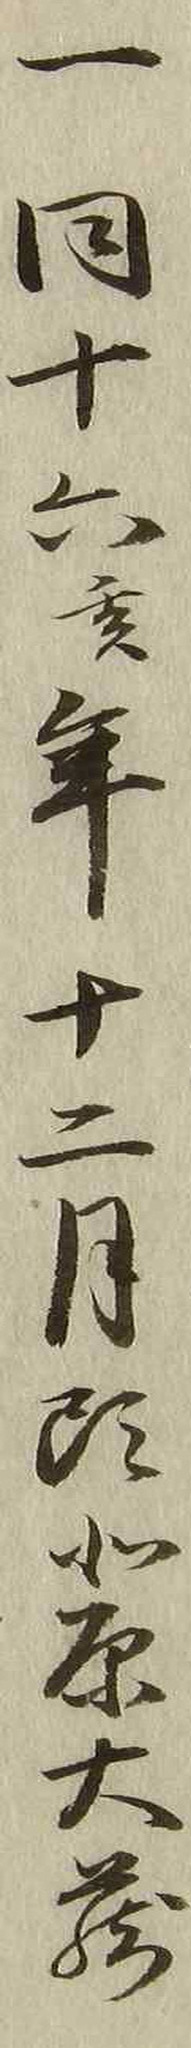一同十六亥年十二月頭北原大蔵
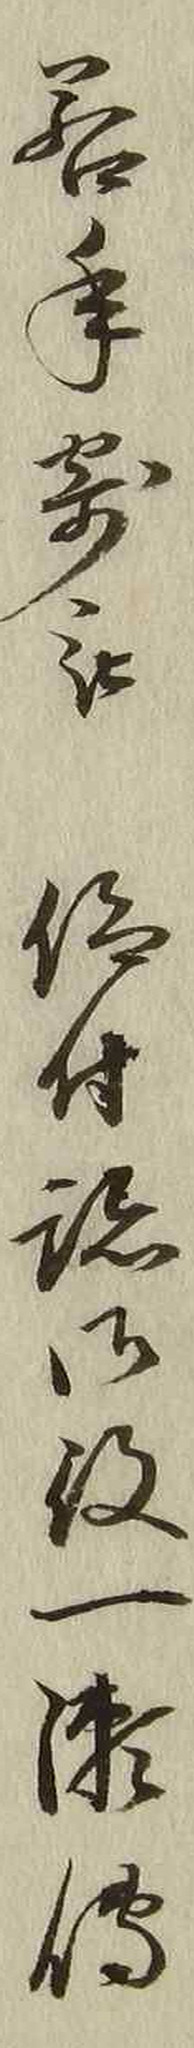若年寄被仰付跡御役一瀬伝
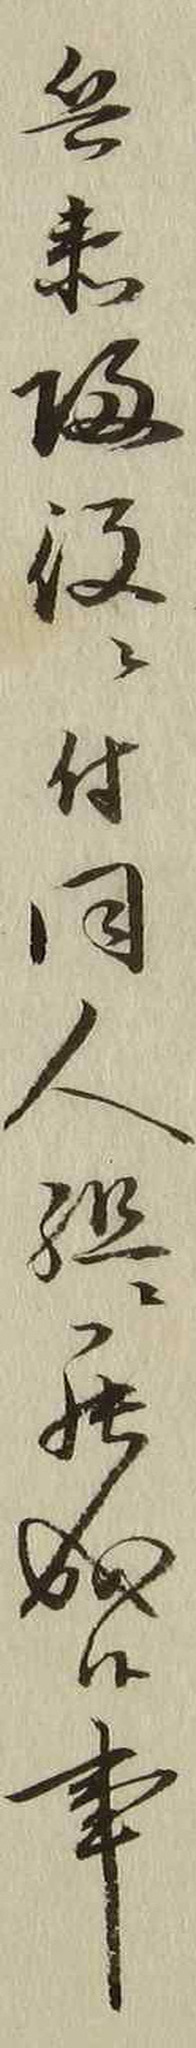兵衛帰役ニ付同人組ニ罷成候事
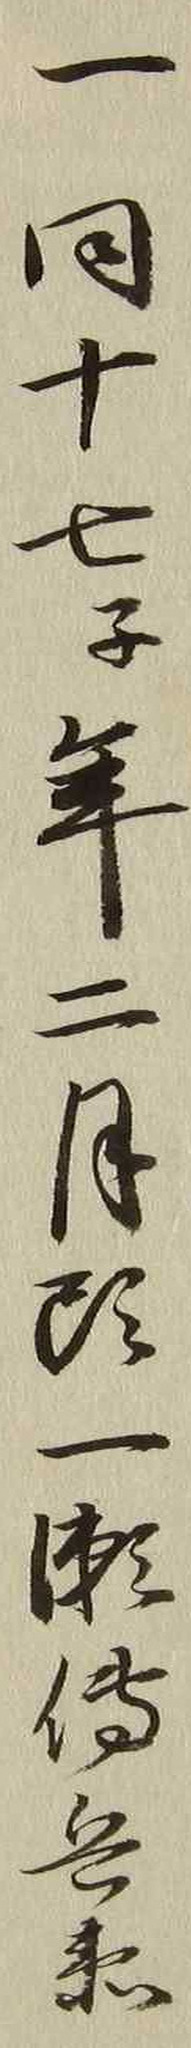一同十七子年二月頭一瀬伝兵衛
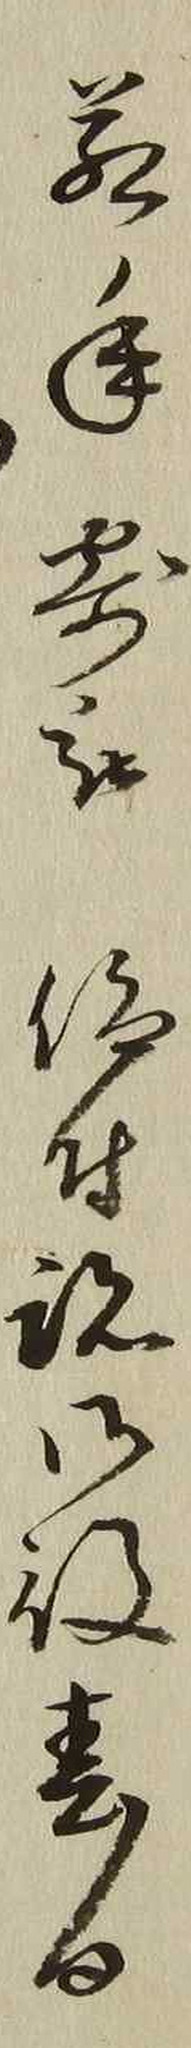若年寄被仰付跡御役春日
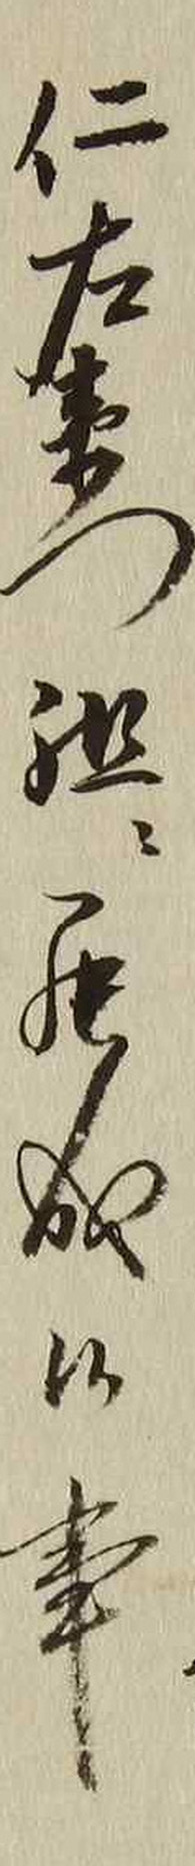仁左衛門組ニ罷成候事
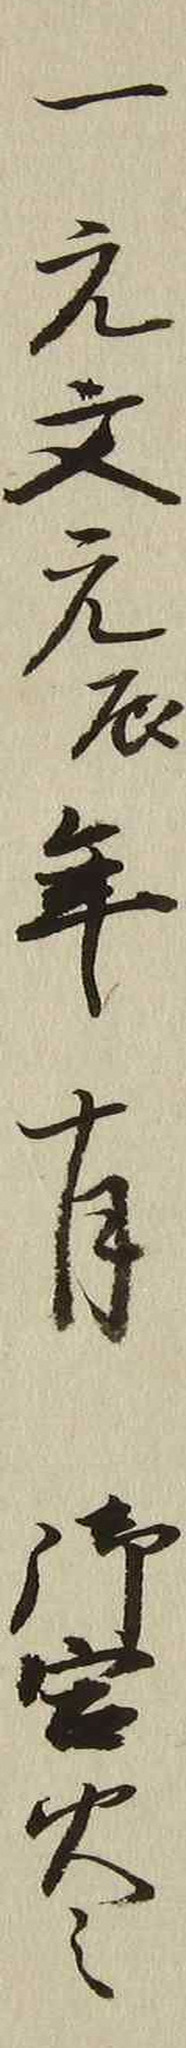一元文元辰年十月御宮火之
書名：諸士系譜　巻之61　と之部4
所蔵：会津若松市立会津図書館
